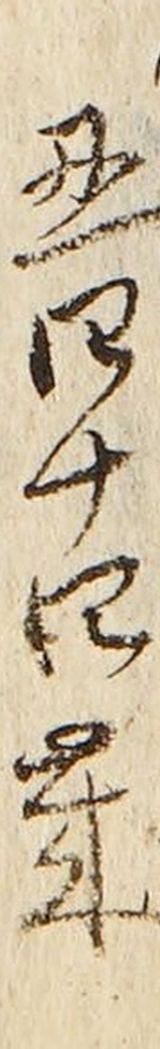丑四十四歳
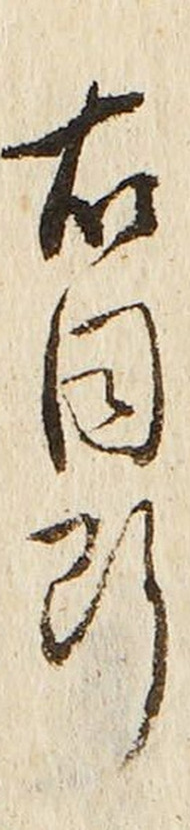右同断
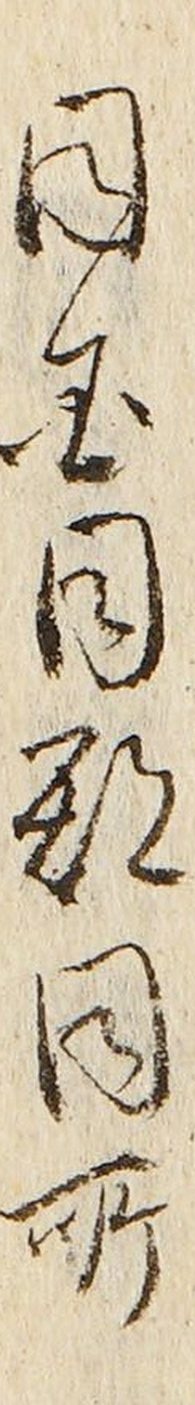同国同郡同所
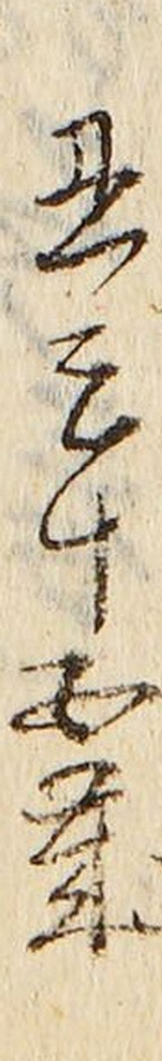丑三十五歳
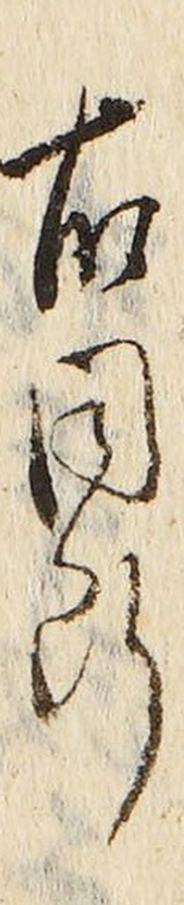右同断
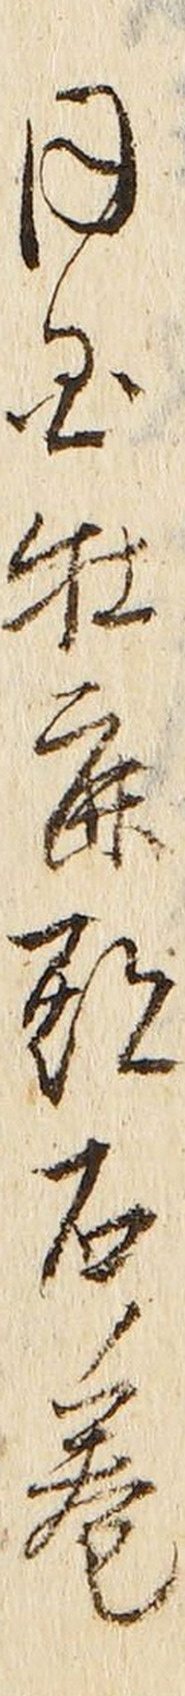同国牡鹿郡石ノ巻
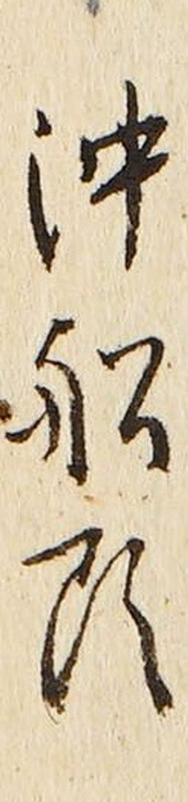沖船頭
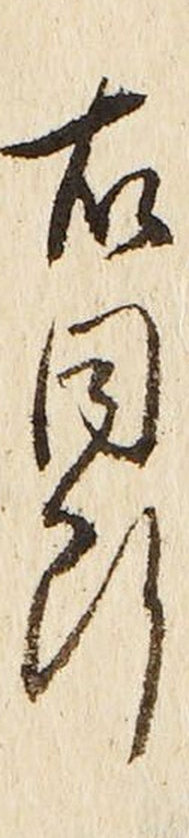右同断
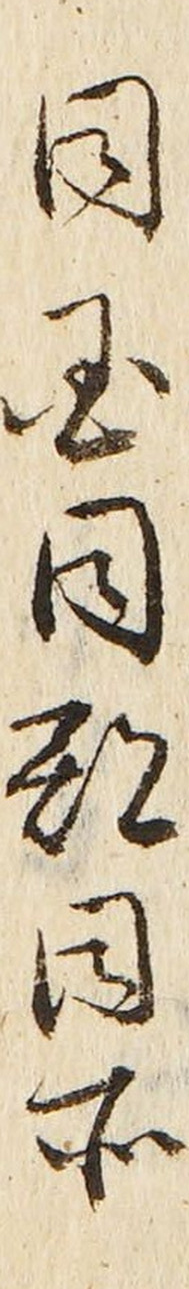同国同郡同所
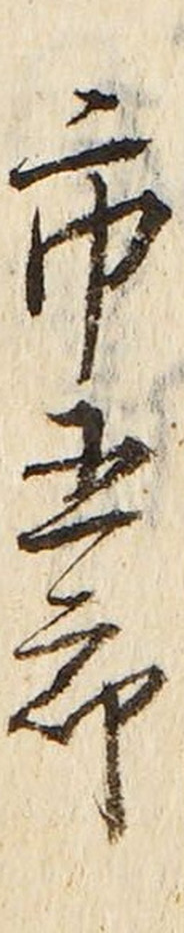市五郎
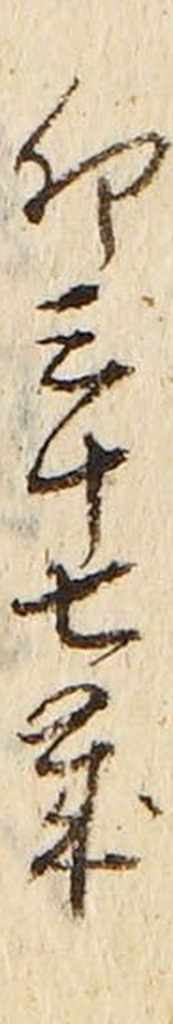卯三十七歳
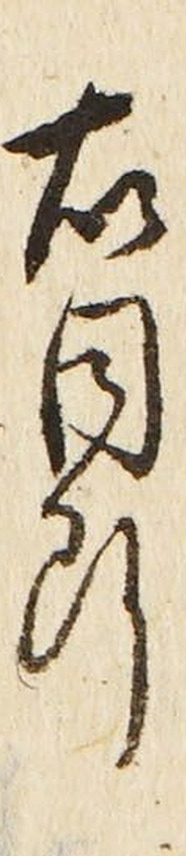右同断
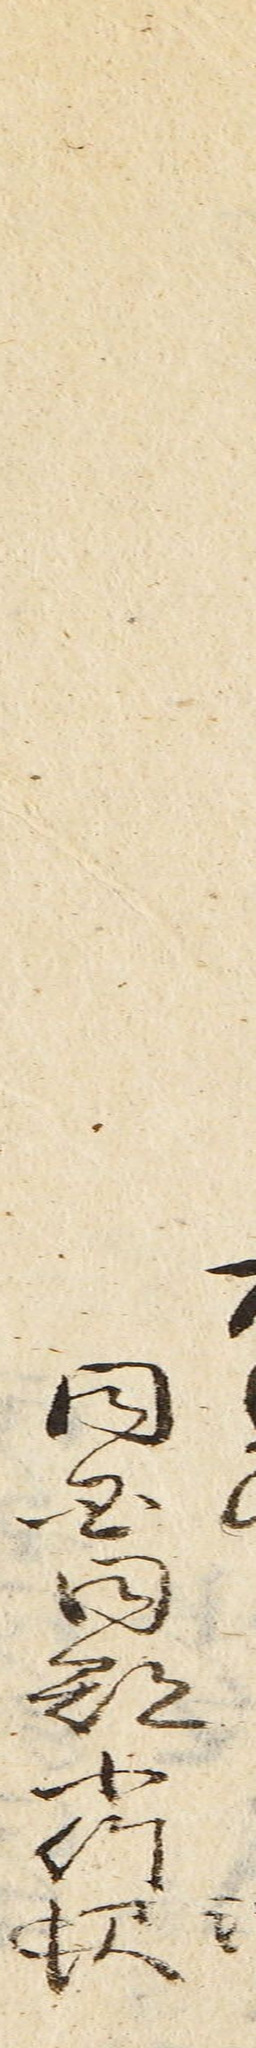同国同郡小竹浜
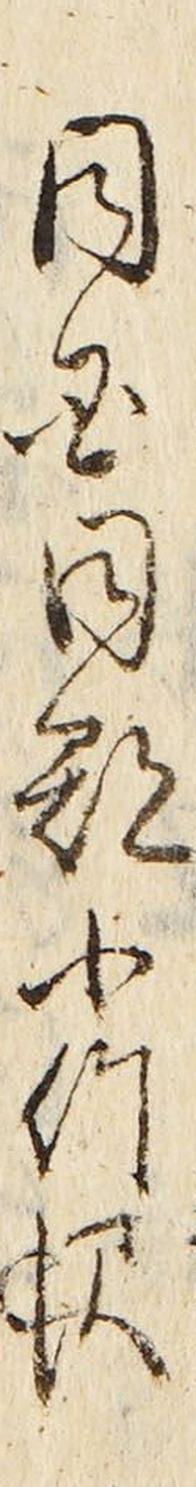同国同郡小竹浜
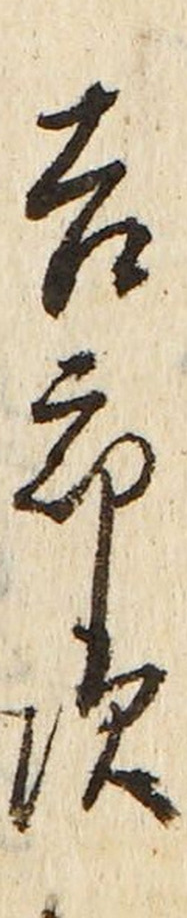吉郎次
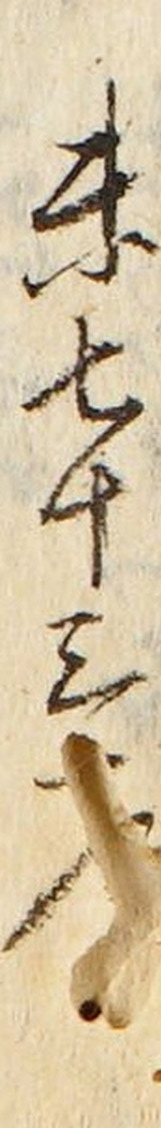未七十三才
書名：漂民後記
